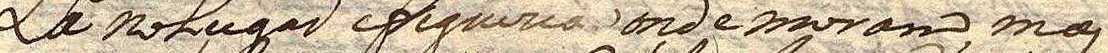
Lá no Lugar e freguezia onde moram, mas
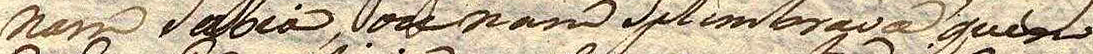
nam sabia, ou nam se lembrava quem
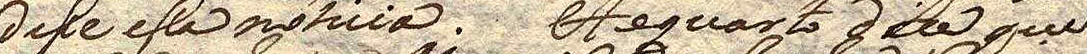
disse esta noticia. Ao quarto diçe que
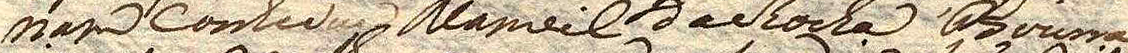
nam Conhescia Manoel da Rocha Bezerra
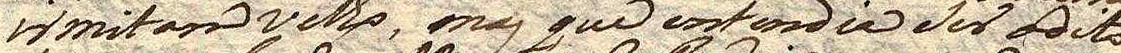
irmitam velho, mas que entendia ser o dito
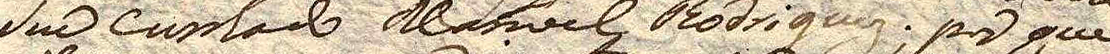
seu cunhado Manoel Rodriguez; por que
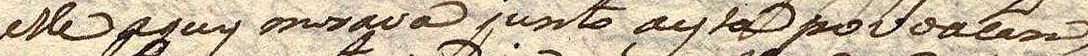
elle aquy morava junto a esta povoaçam,
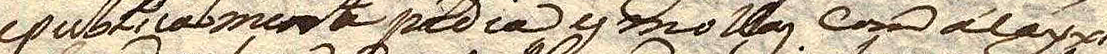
e pubLicamente pedia esmollas com a cayxi
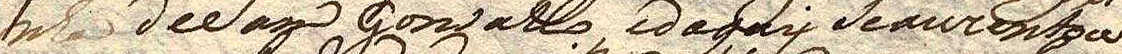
nha de Sam gonsallo e daquy se azuentou
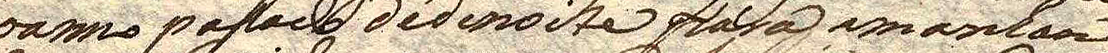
o anno pasado de de noite para a manhan,
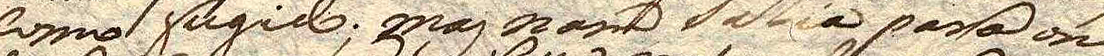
como fugido; mas nam sabia para on
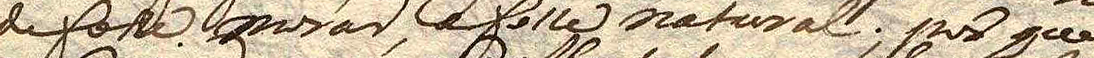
de fosse morar, e fosse natural; por que
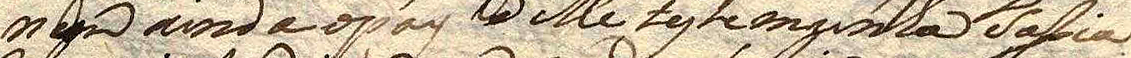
nem ainda o pay delle testemunha sabia.
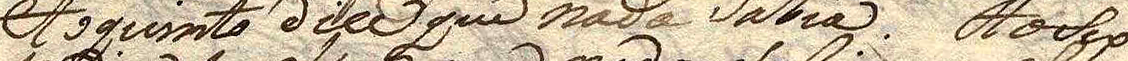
Ao quinto dice que nada sabia. Ao Sex
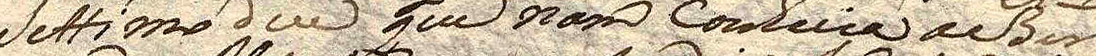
settimo dice que nam conhecia a Ber
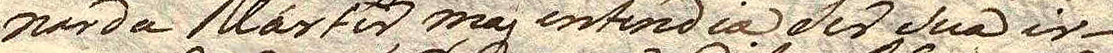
narda Mártir, mas entendia ser sua ir
